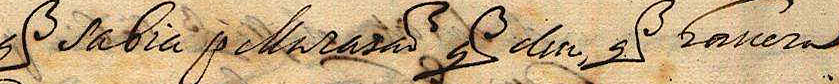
q̄ sabia pella rasaõ q̄ dise, q̄ hauera
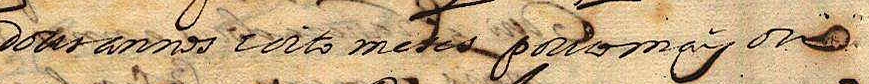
dous annos e oito meses pouco mais ou
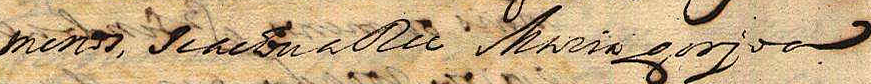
menos, se achou a Ree Maria gorjoa
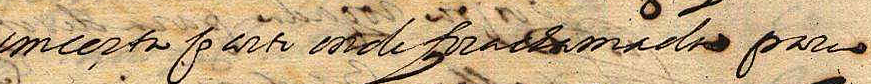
em certa parte onde fora chamada para
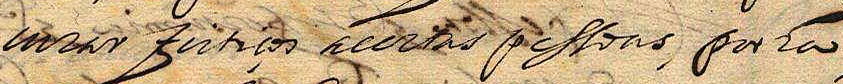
curar feitiços a certas pessoas, por ha
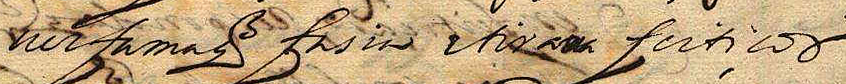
uer fama q̄ fasia E tiraua feitiços
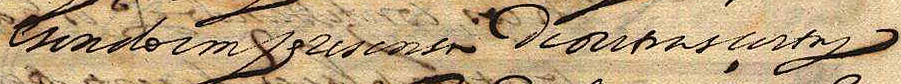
e sendo em presensa de outras certas
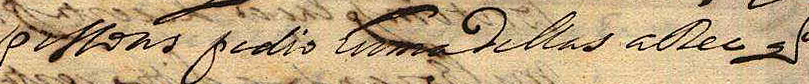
pessoas pedio huma dellas a Ree q̄
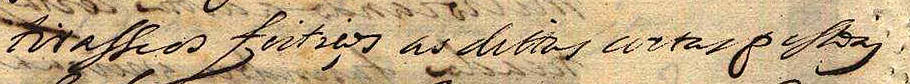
tirasse os feitiços as dittas certas pessoas
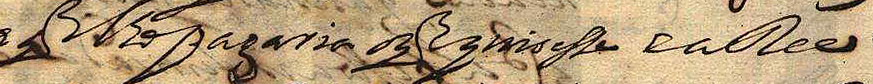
E q̄ lho pagaria o q̄ quisesse E a Ree
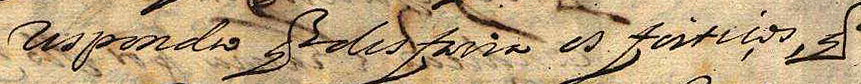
respondeo q̄ desfaria os feitiços, q̄
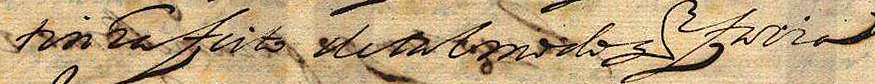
tinha feito de tal modo q̄ faria
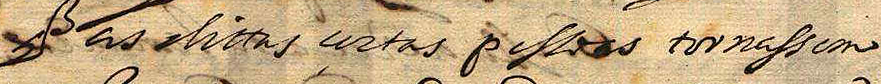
q̄ as dittas certas pessoas tornassem
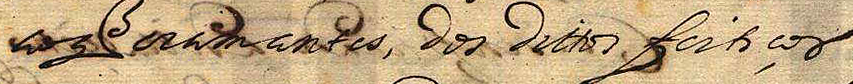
ao q̄ eram antes, dos dittos feitiços
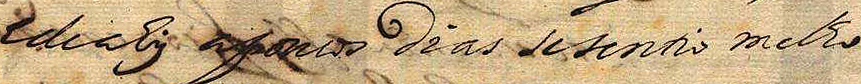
E de ahy a poucos dias se sentio melho
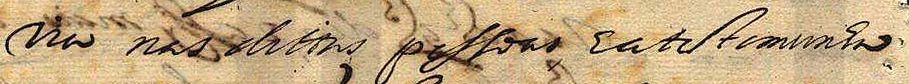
ria nas dittas pessoas, E a testemunha
